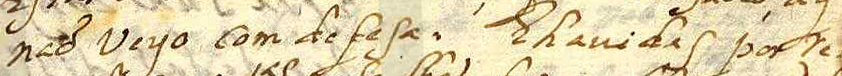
naõ veyo com defesa. E hauidas por re
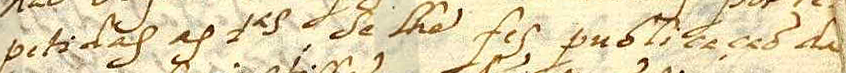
petidas as tas se lhe fes publicaçaõ da
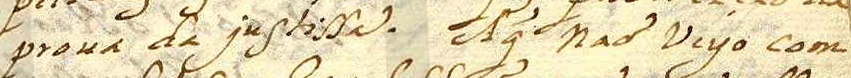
proua da justissa. A q̄ naõ veyo com
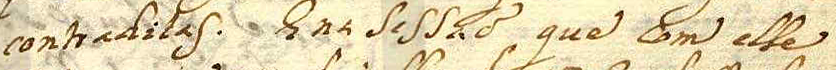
contraditas. E na sessaõ que com elle
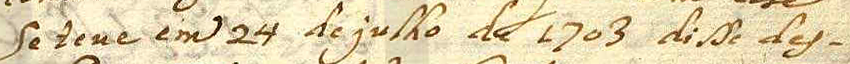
se teue em 24 de julho de 1703 disse des
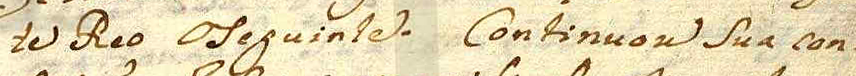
te Reo o seguinte. Continuou sua con
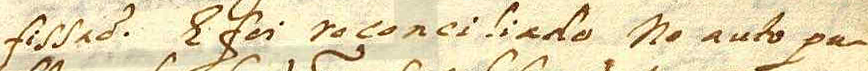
fissaõ. E foi reconciliado no auto pu
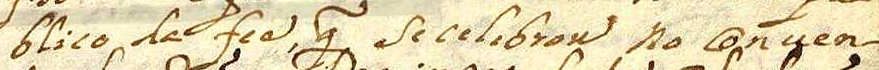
blico da fee, q̄ se celebrou no conuen
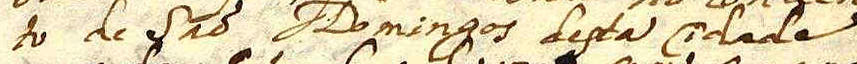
to de Saõ Domingos desta Cidade
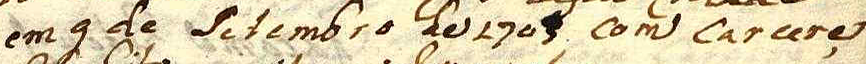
em 9 de Setembro de 1703 com carcere,
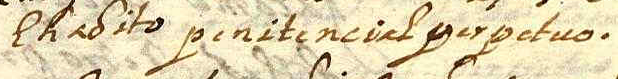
E habito penitencial perpetuo.
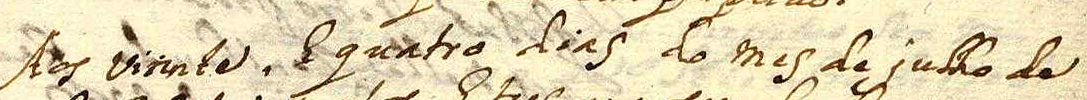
Aos vinnte, E quatro dias do mes de julho de
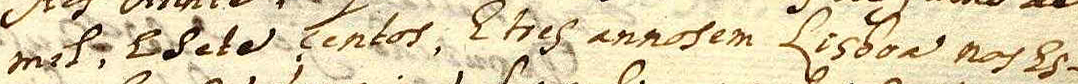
mil, E setecentos, E tres annos em Lisboa nos Es
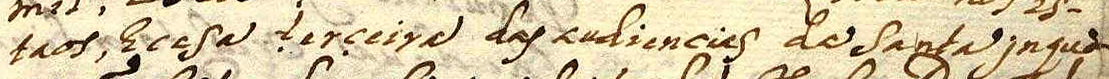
taos, E casa terceira das audiencias da santa jnqui
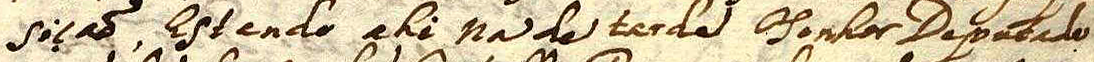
siçaõ, Estendo ahi na de tarde o Senhor Deputado
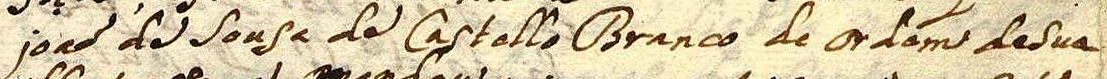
joaõ de Sousa de Castello Branco de ordem de sua
